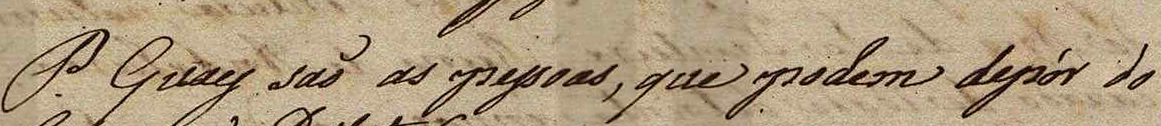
P. Quaes saõ as pessoas, que podem depór do
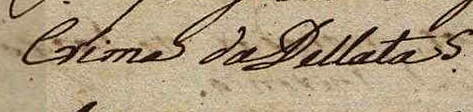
Crime da Dellata?
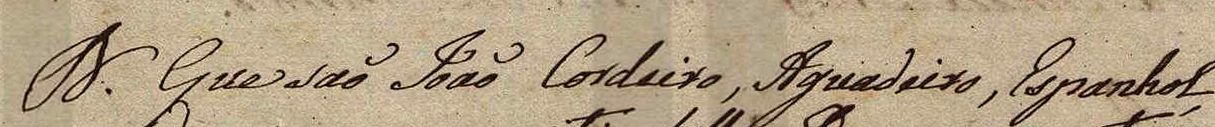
D. Que saõ Ioaõ Cordeiro, Aguadeiro, Espanhol
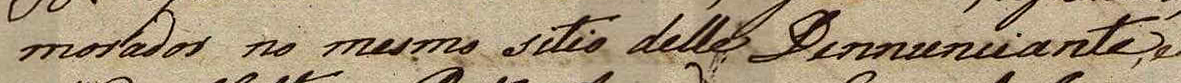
morador no mesmo sitio delle Dennunciante, e
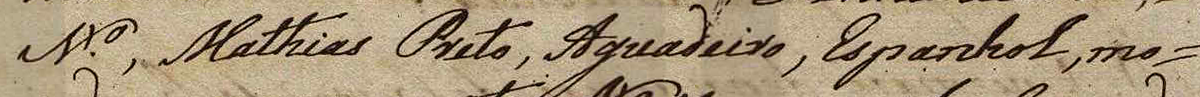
N.o, Mathias Preto, Aguadeiro, Espanhol, mo
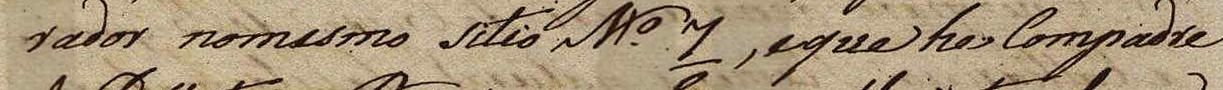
rador no mesmo sitio N.o 7, e que he Compadre
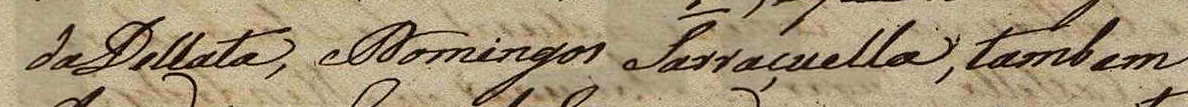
da Dellata, e Domingos Sarraçuella, tambem
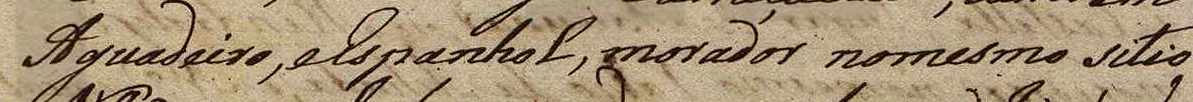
Aguadeiro, e Espanhol, morador no mesmo sitio
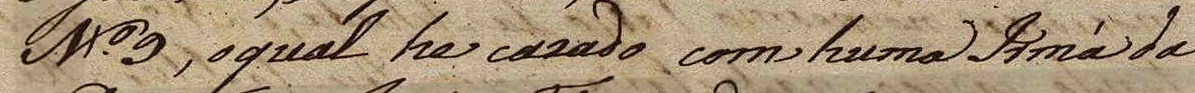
N.o 9, o qual he cazado com huma Irmã da
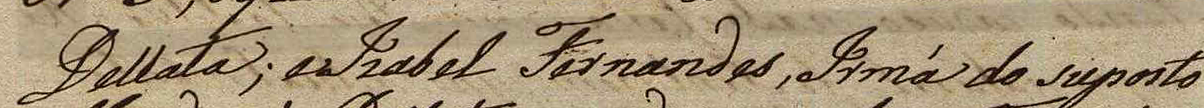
Dellata; e Izabel Fernandes, Irmã do suposto
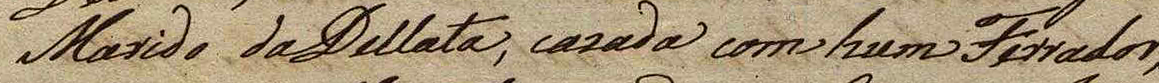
Marido da Dellata, cazada com hum Ferrador,
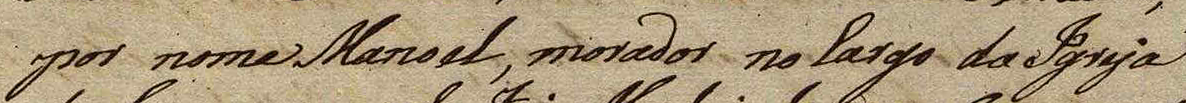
por nome Manoel, morador no largo da Igreja
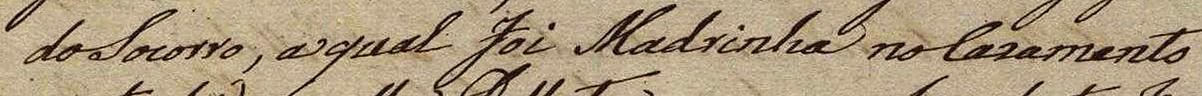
do Socorro, a qual foi Madrinha no Cazamento
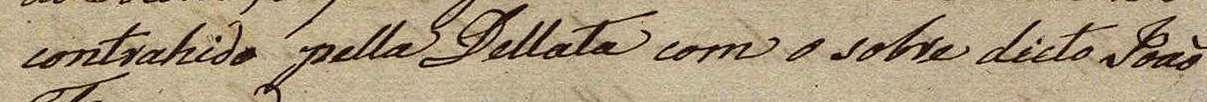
contrahido pella Dellata com o sobredicto Ioão
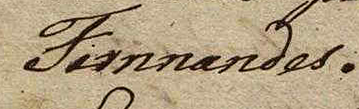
Fernnandes.
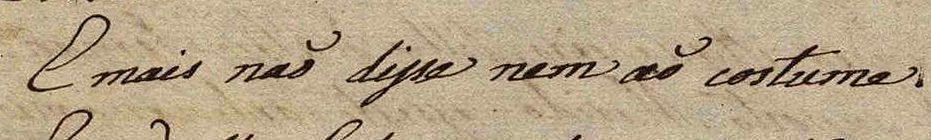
E mais naõ disse nem aó costume.
